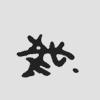{爻戈止}
